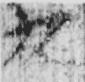九
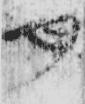月
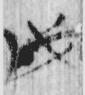戊
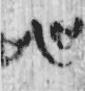申
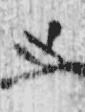之
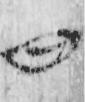日
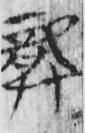龔
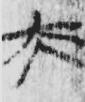夫
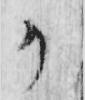人
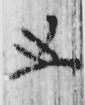之
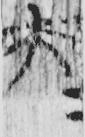大夫
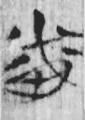番
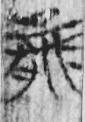○（嬴）
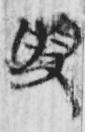受
